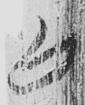㠯（以）
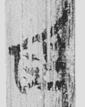爲
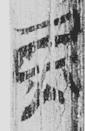○（己）
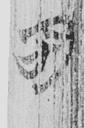名
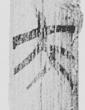夫
